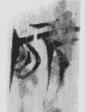所
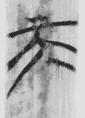天
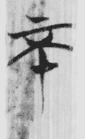不
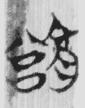豫
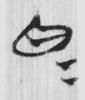白=
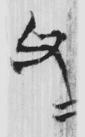父=
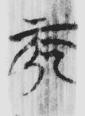而
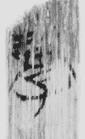{𫯁子}
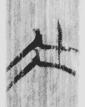太
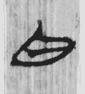白
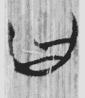曰
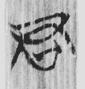君
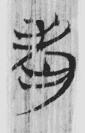老
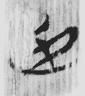臣
